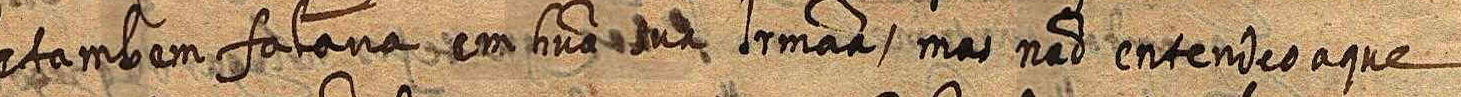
e tambem falaua em huā sua Irmāa / mas não entendeo a que
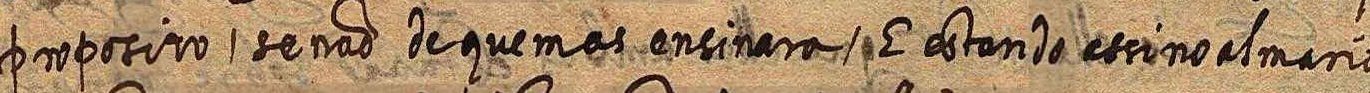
proposito / se não de quem as ensinara / E estando assi no almario
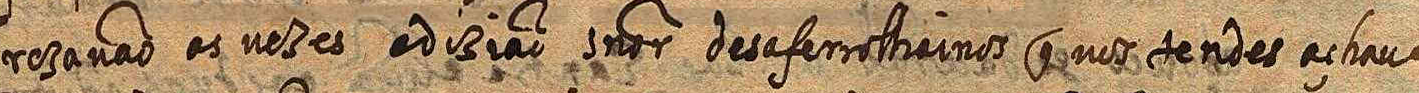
rezauão as uezes e dizião snōr desaferrolhainos q̄ uos tendes a chaue
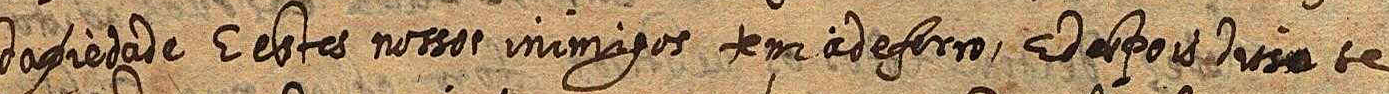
da piedade E estes nossos inimigos tem a de ferro / E despois disso se
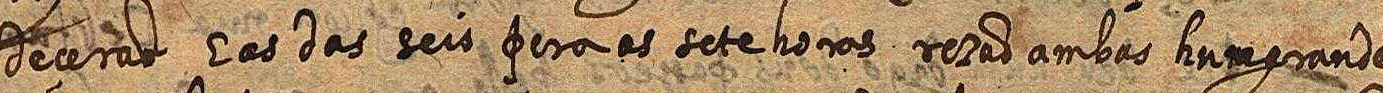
deçerão E as das seis pera as sete horas rezão ambas hum grande
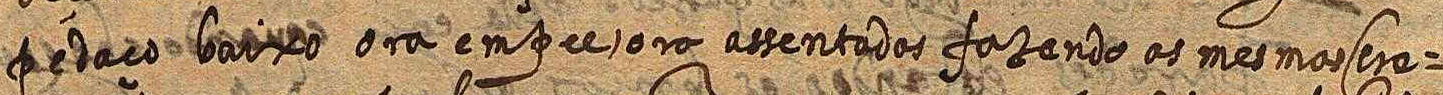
pedaço baixo ora em pee / ora assentadas fazendo as mesmas Cere
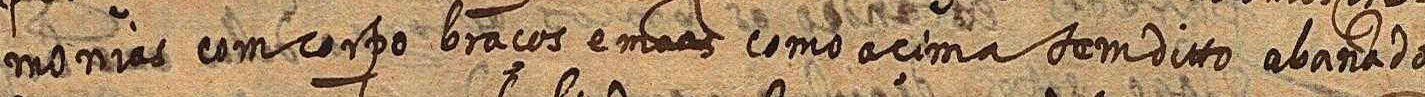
monias com corpo braços e mãos como açima tem ditto abanādo
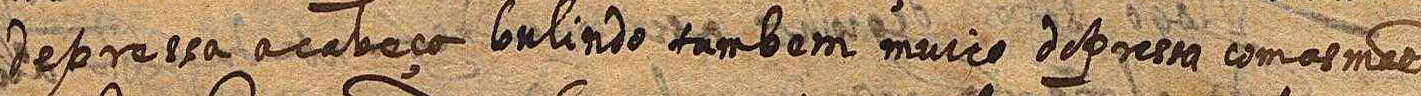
depressa a cabeça bulindo tambem muito depressa com as mãos
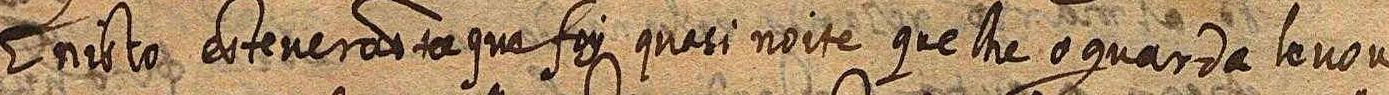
E nisto esteuerão tee que foy quasi noite que lhe o guarda leuou
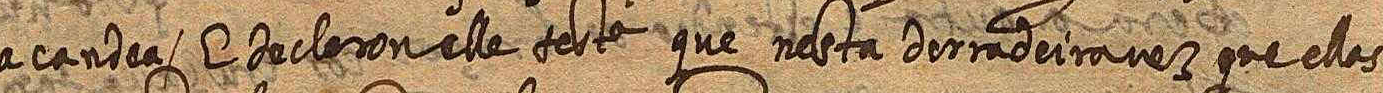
a candea / E declarou elle testa que nesta derradeira uez que ellas
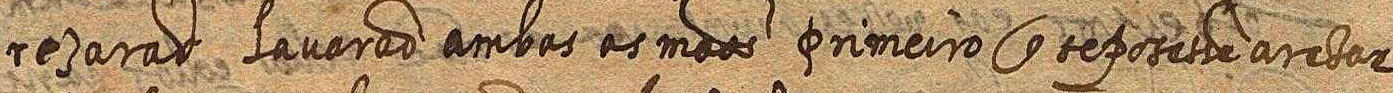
rezaraõ Lauarão ambas as mãos primeiro q̄ se posessē a rezar
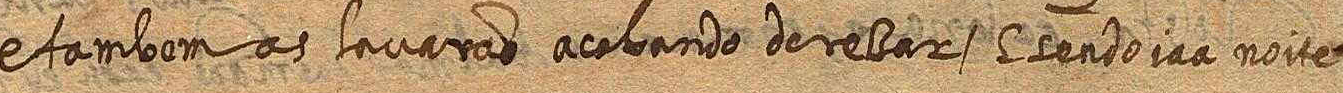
e tambem as lauarão acabando de rezar / E sendo iaa noite
